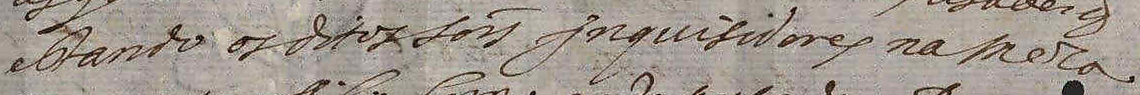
estando os ditos sōrs Jnquisidores na meza
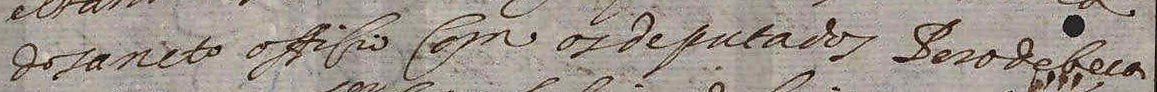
do sancto officio Com os deputados Pero de beça
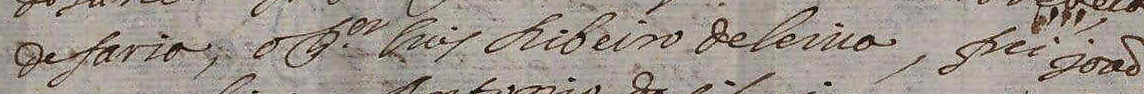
de faria, o D.or Luis Ribeiro de leiua, frei Joaõ
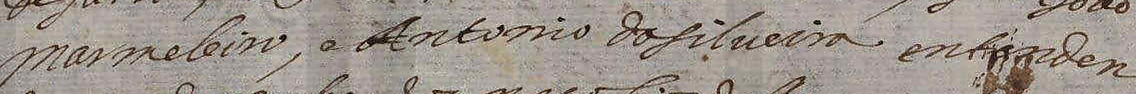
Marmeleiro, e Antonio da silueira entenden
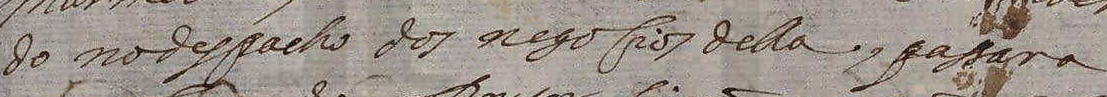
do no despacho dos negoCios della, passara
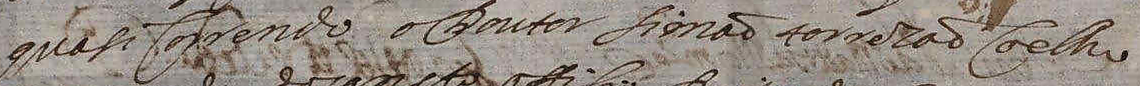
quasi Correndo o Doutor Simão torrezão Coelho
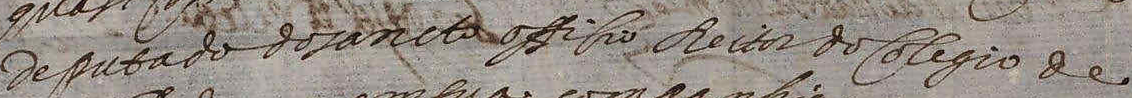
deputado do sancto officio Reitor do Colegio de
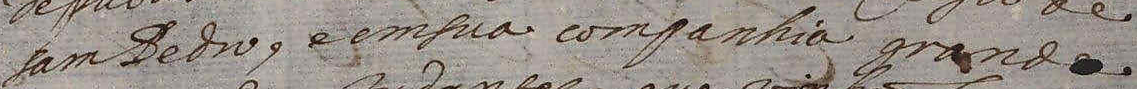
sam Pedro, e em sua companhia grande
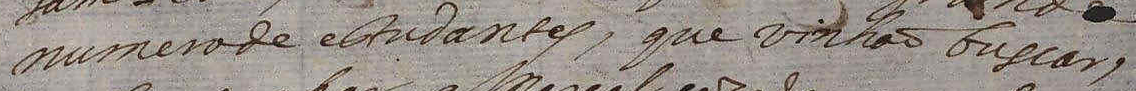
numero de estudantes, que vinhaõ buscar,
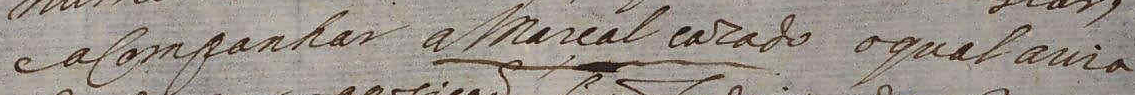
e acompanhar a Marçal cazado o qual auia
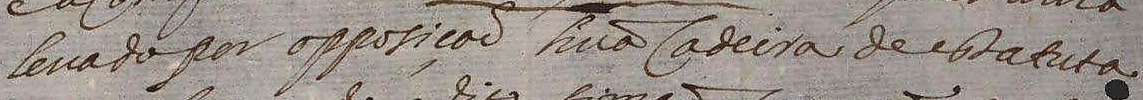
leuado per opposição huā Cadeira de estatuto
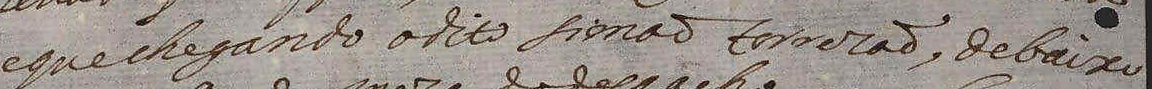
e que chegando o dito simaõ torrezaõ, de baixo
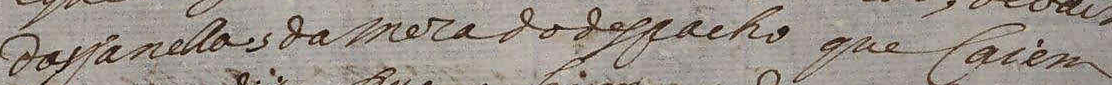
das janellas da meza do despacho que Caiem
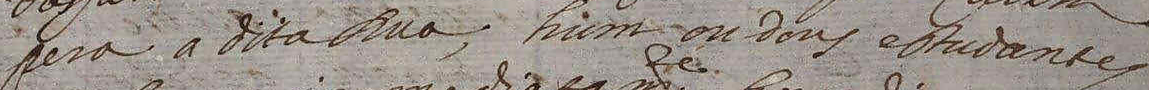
pera a dita Rua, hum ou dous estudantes
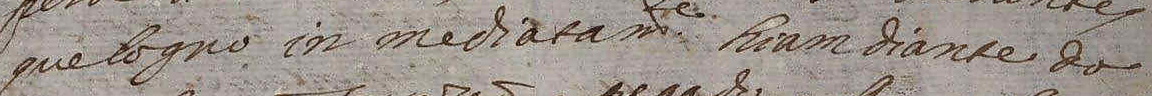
que loguo inmediatam.te hiam diante do
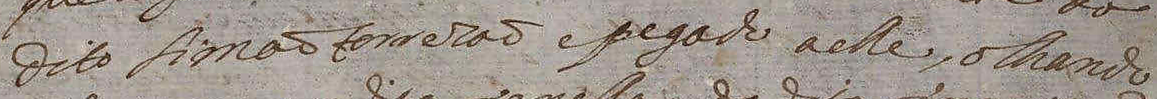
dito Simão torrezaõ e pegado a elle, olhando
